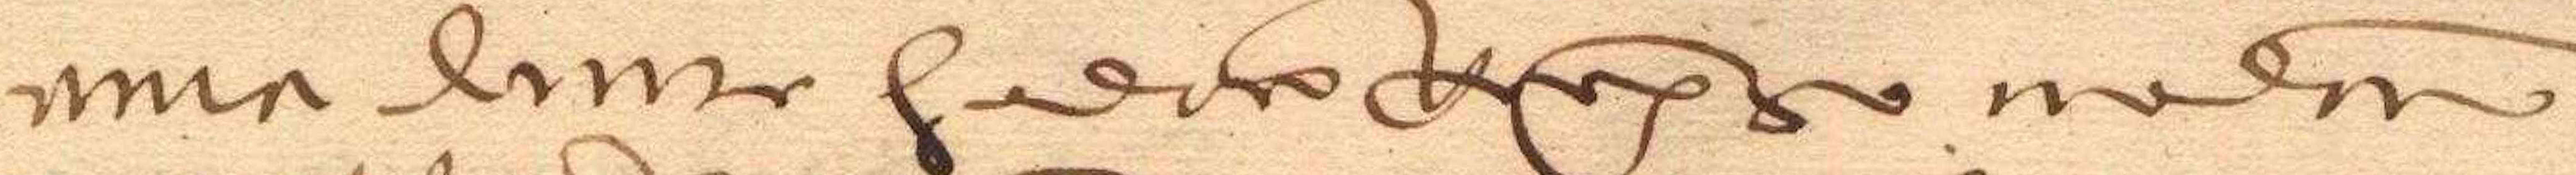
cama doente ho dito Reo p̄so no dito
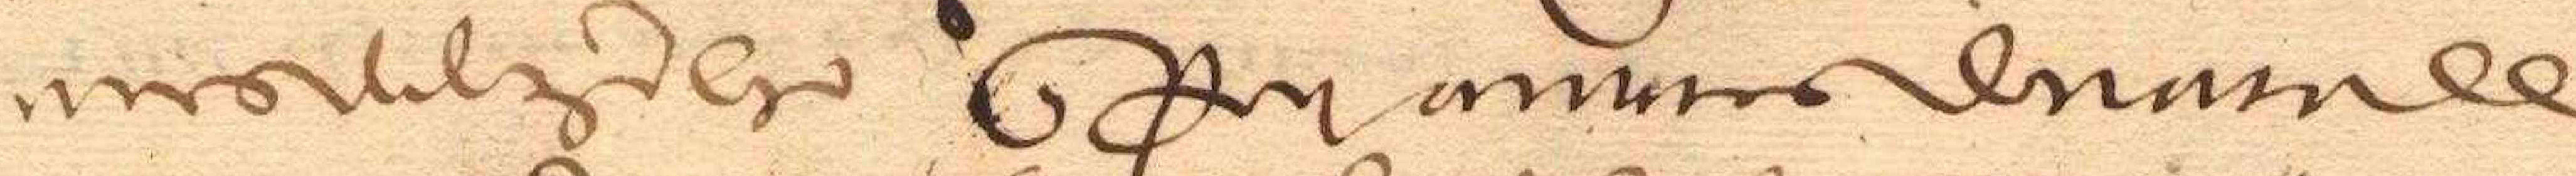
mes de dezēbro q̄ foy amtes do natall
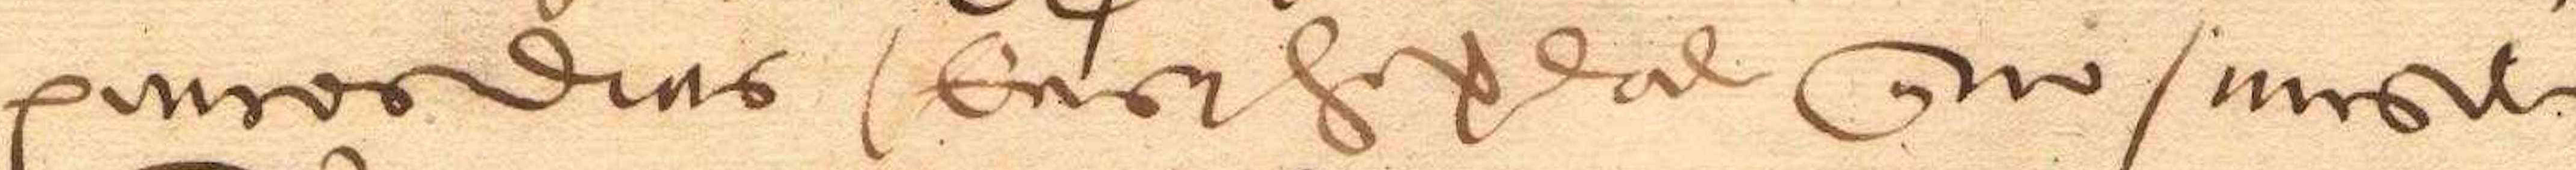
poucos dias / E asy he ꝟdade q̄ no / mes de
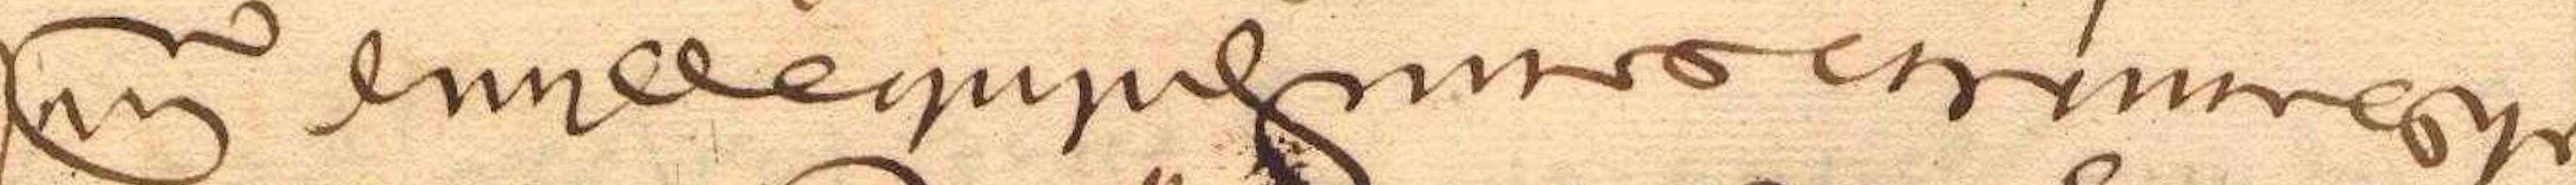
Jānro de mjll e qujnhentos e trynta e sejs
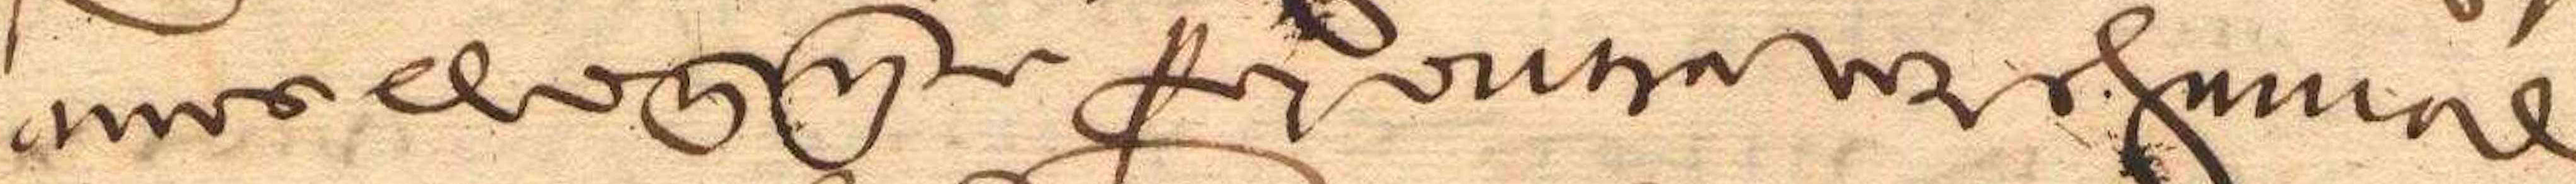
anos lloguj̄te foj outra vez chamado
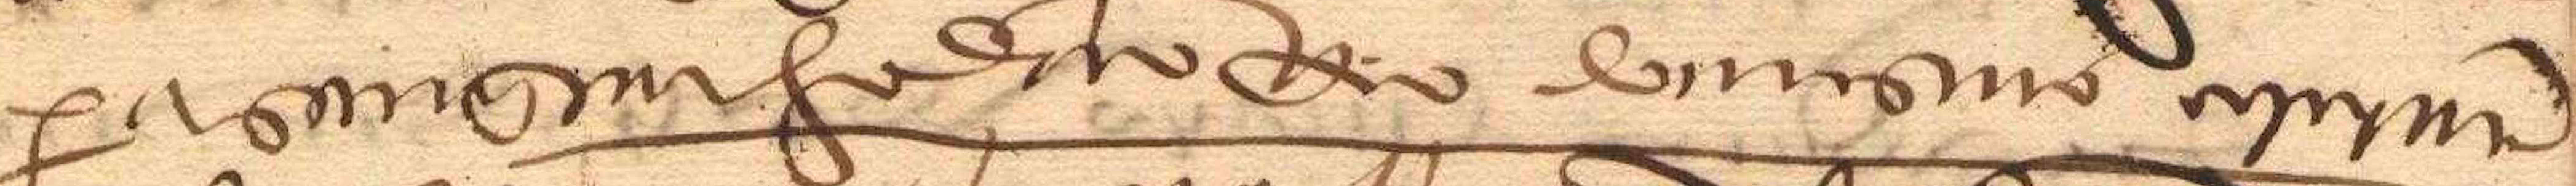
ꝑa sangrar ho dito Reo do mesmo corrymē
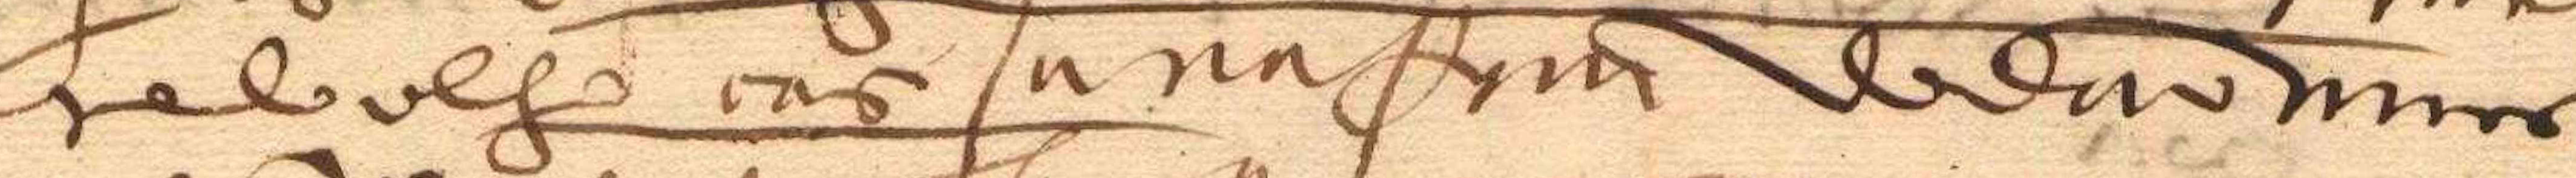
to do olho case Ja na fym do dito mes
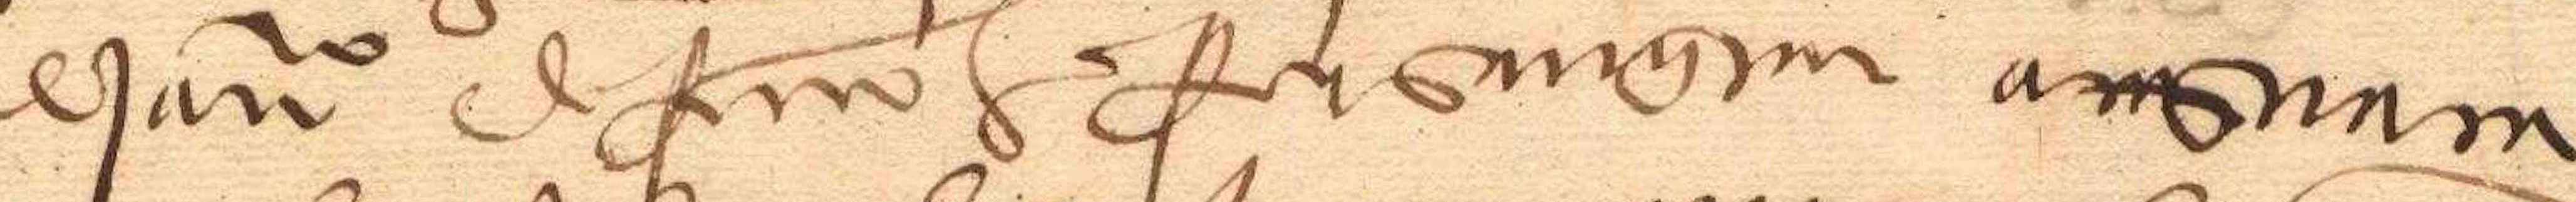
de Janro e de feito ho foy sangrar a sua ca
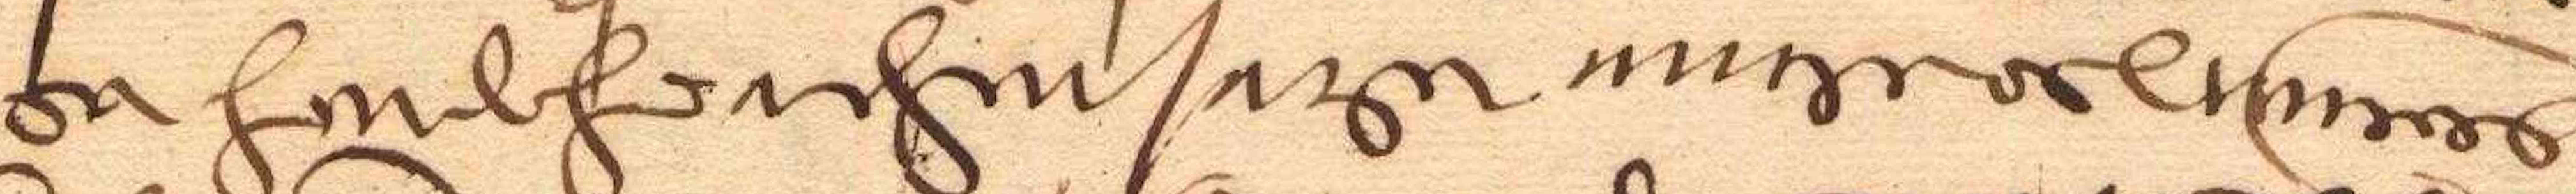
sa honde ho achou Jazer antre os lemçoes
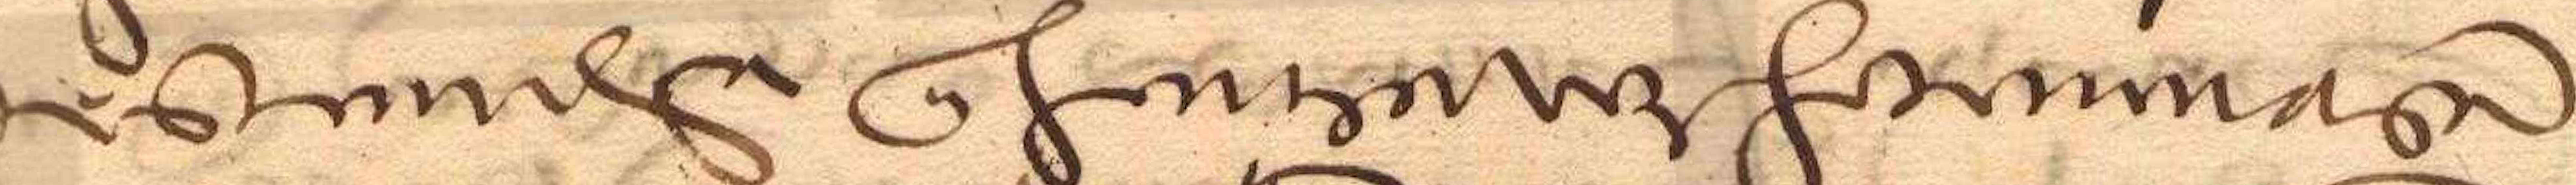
testemunha q̄ houtra vez ho tornou a sā
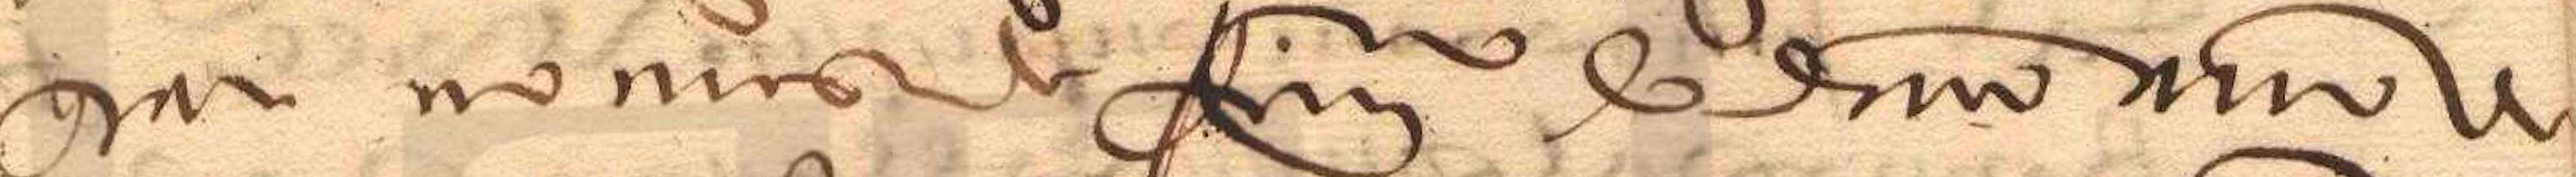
grar no mes de fēuro do dito an̄o de
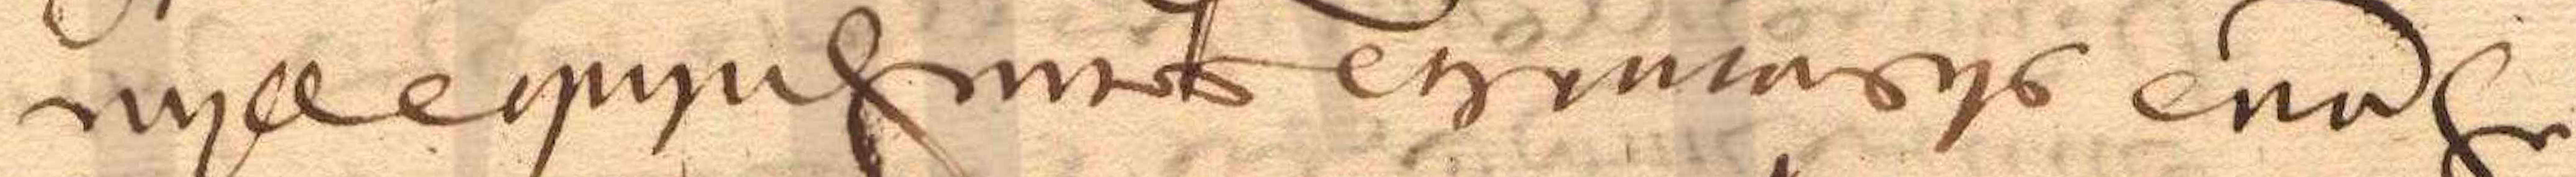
mjll e qujnhentos e trynta sejs e nā he
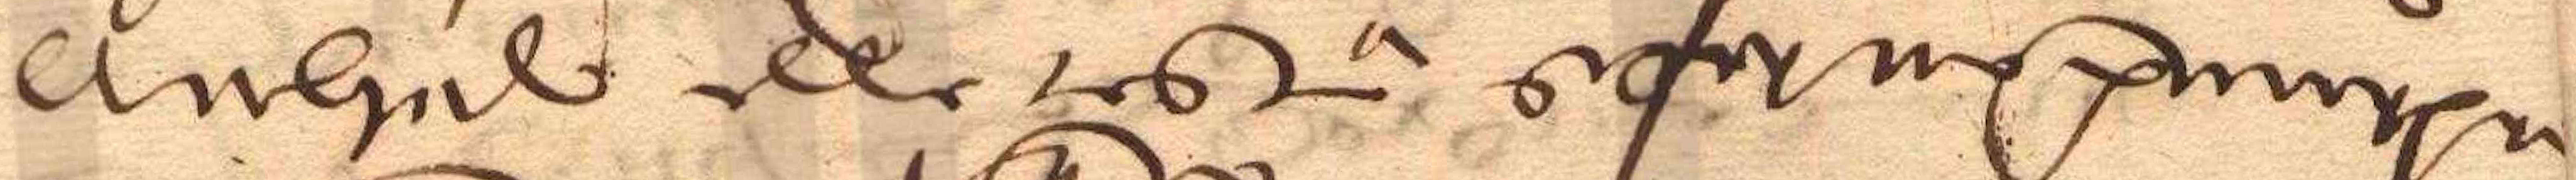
llenbrado elle testa se foy no p̄incypyo
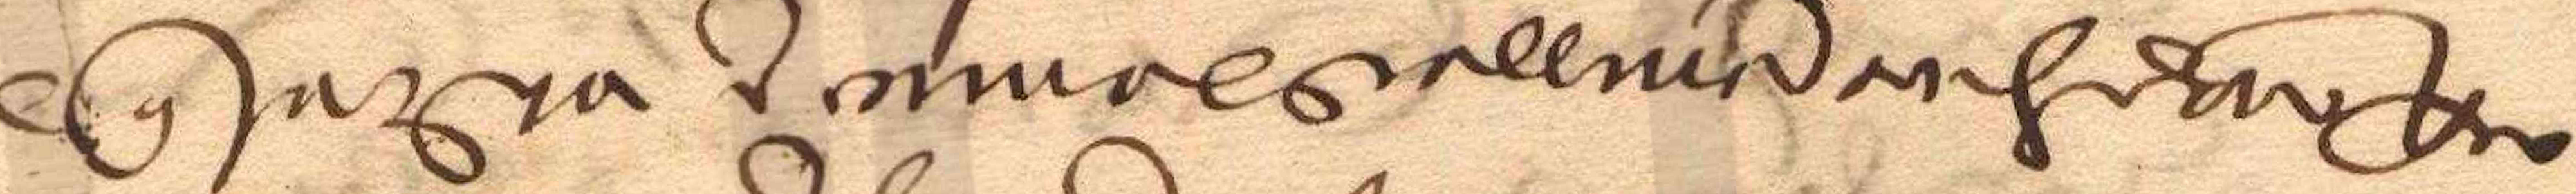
e q̄ Jazya ē cama e se alleuātou ho dito Reo
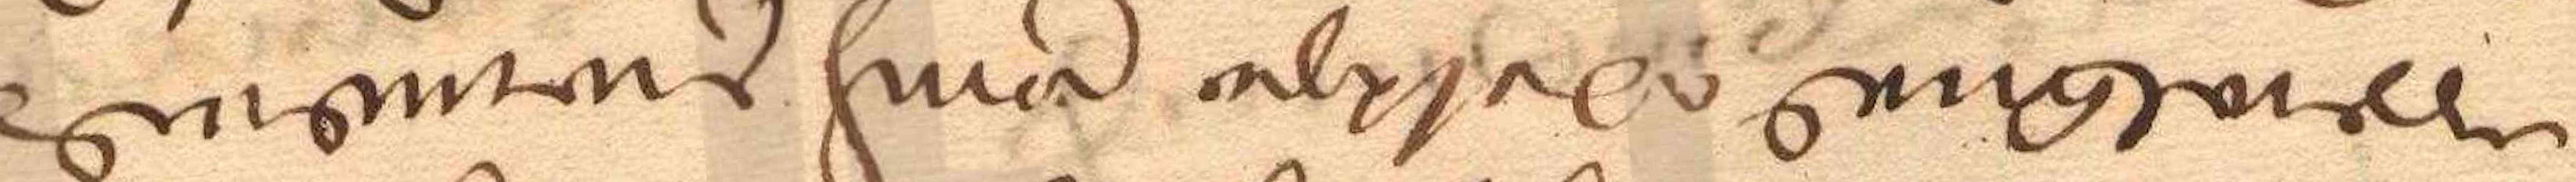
e se asentou ē huā cadeyra e o sangrou elle
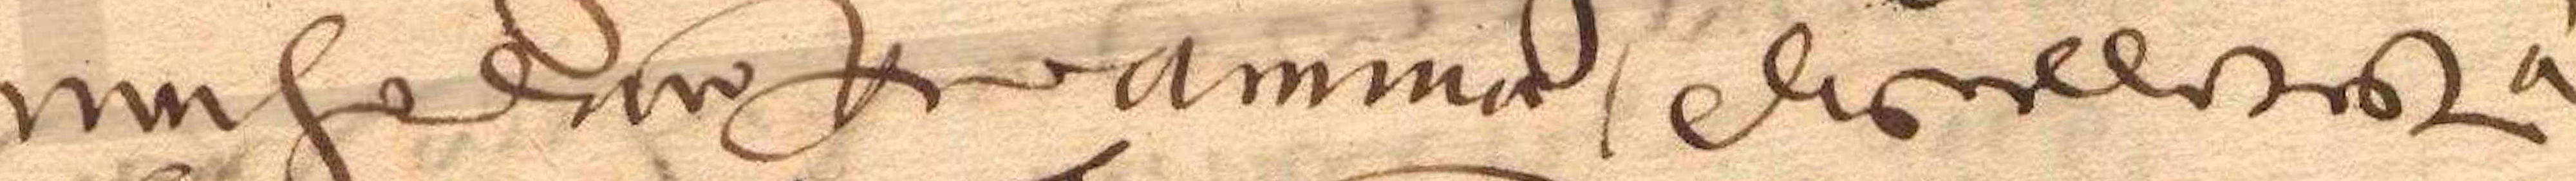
nou ho dito Reo a cama / e dise elle testa
